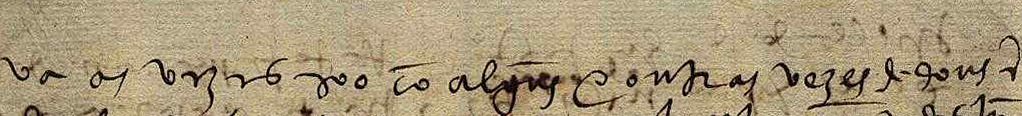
va as vezes soo c̄o algūs e outras vezes de dous ē
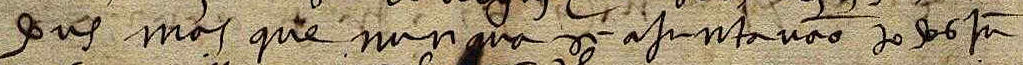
dous mas que nunqua se aJuntauão todos Jū
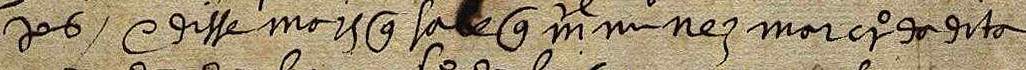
tos / e disse mais q̄ sabe q̄ mel nunez marcro da dita
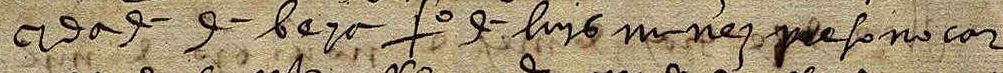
cydade de beya fo de lujs nunez preso no car
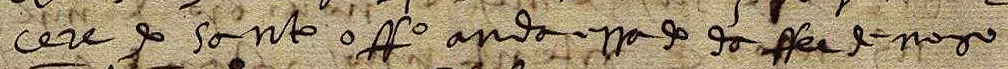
cere do santo offo anda errado da ffee de noso
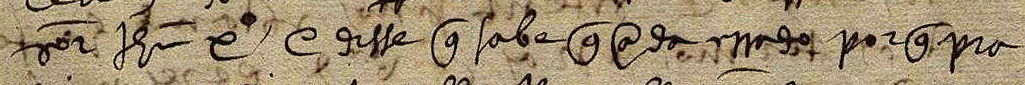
sōr Jhū xo / e disse q̄ sabe q̄ āda errado porq̄ pra
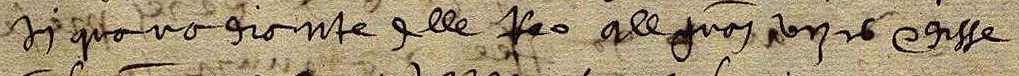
tyquaua diante delle Reo allgūas vezes e disse
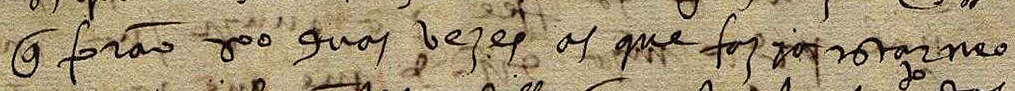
q̄ forão soo duas vezes as que fazya escarneo
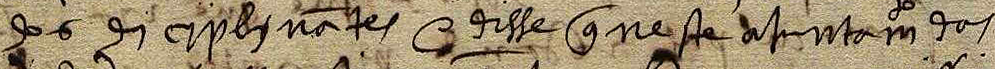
dos dycyplynātes e disse q̄ neste aJuntamto das
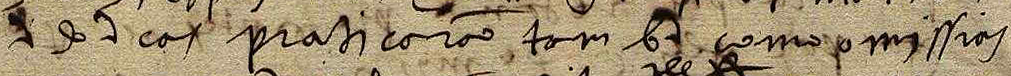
ēdoēças praticaraō tambē como o myssias
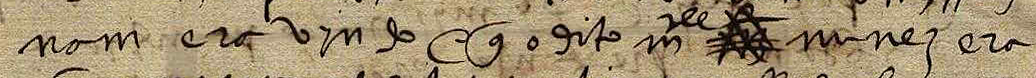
nam era vyndo e q̄ o dito mell frz nunez era
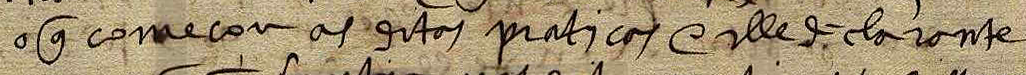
o q̄ começou as ditas pratycas e elle declarante
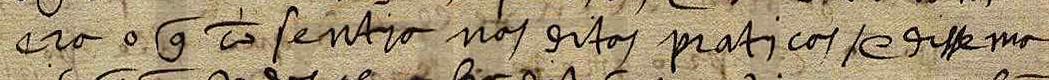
era o q̄ c̄osentya nas ditas pratycas / e disse ma
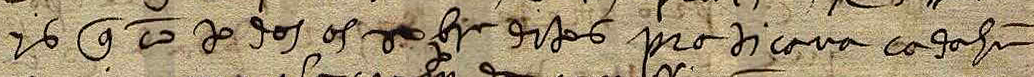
ys q̄ cō todos os sobreditos praticaua cada hū
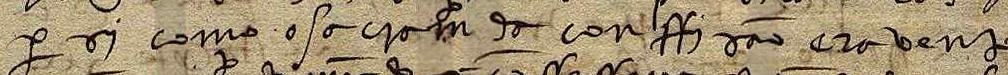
ꝑ sy como o sacramto da conffysão era vento
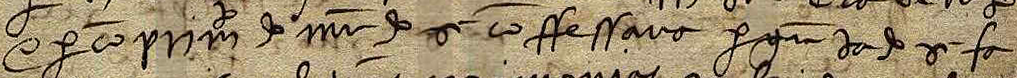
e ꝑ c̄oprymto do mūdo se cōffessaua ꝑgūtado se fa
